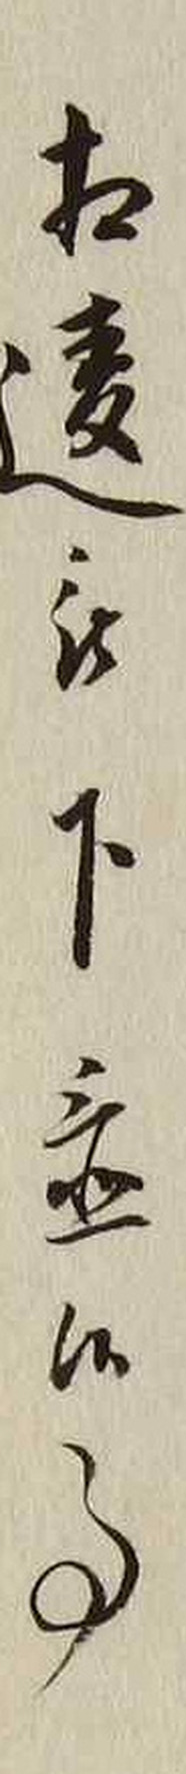相違被下置候事
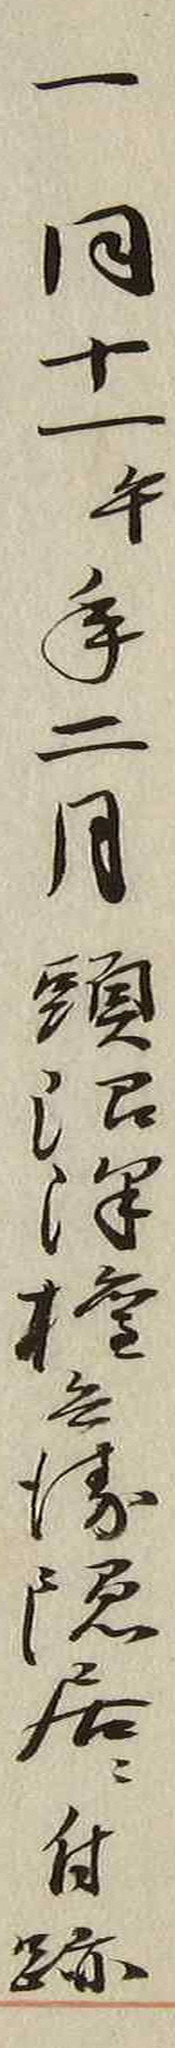一同十一午年二月頭沼沢権兵衛隠居ニ付跡
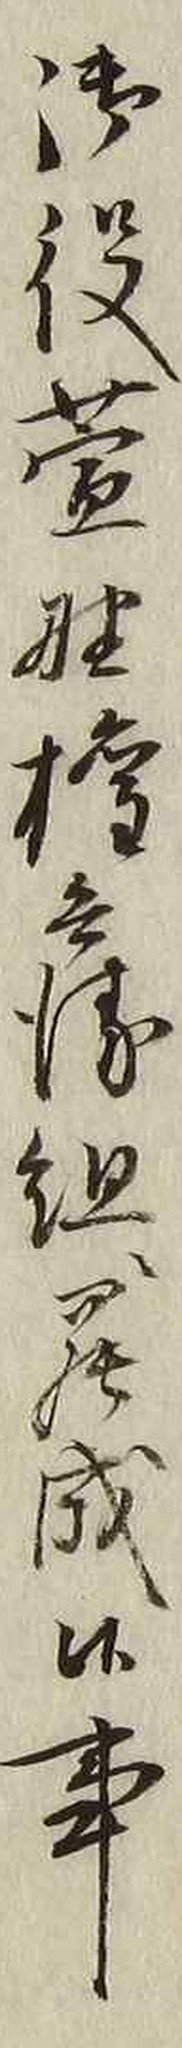御役萱野権兵衛組へ罷成候事
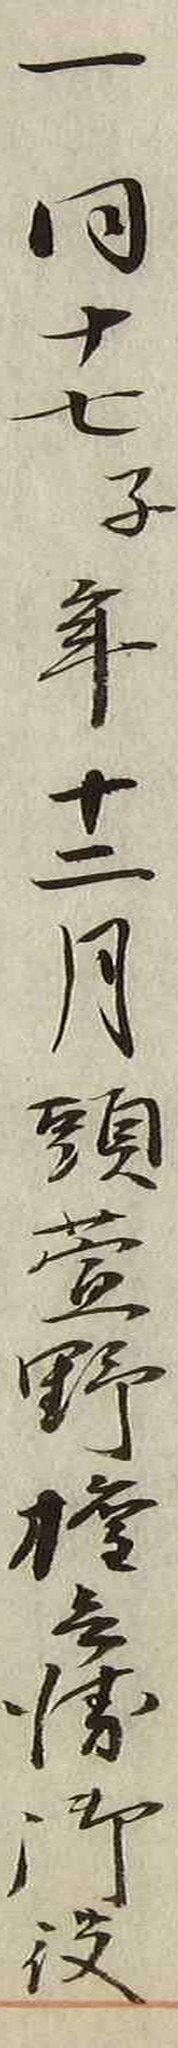一同十七子年十二月頭萱野権兵衛御役
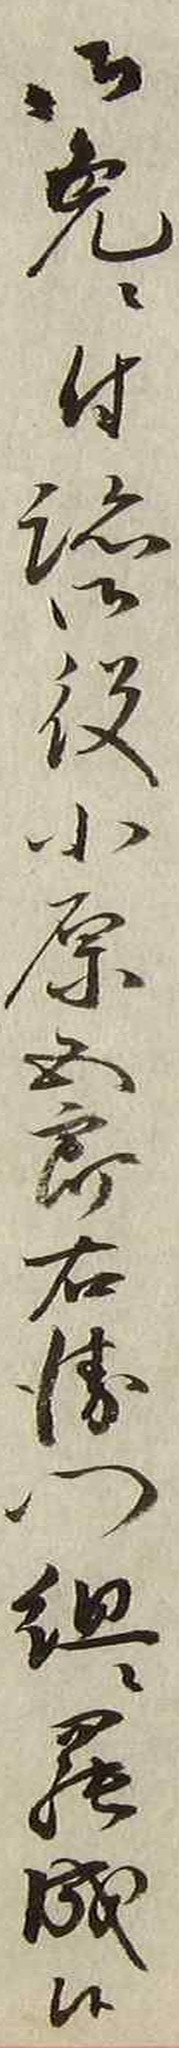御免ニ付跡御役小原五郎右衛門組ニ罷成候
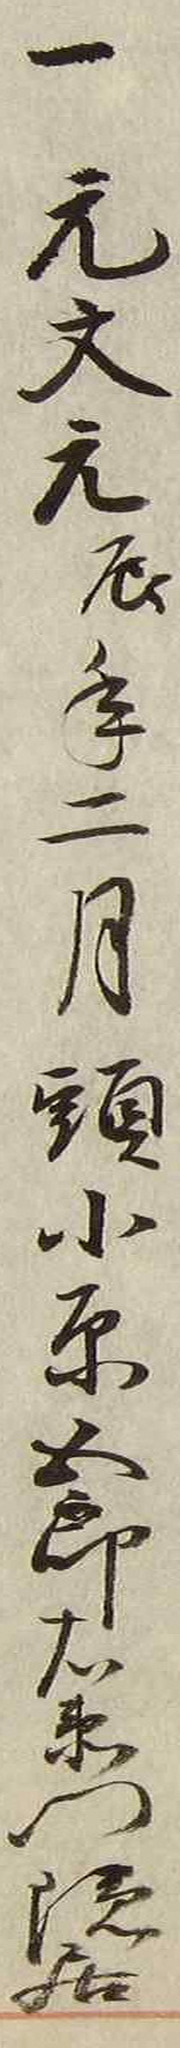一元文元辰年二月頭小原五郎右衛門隠居
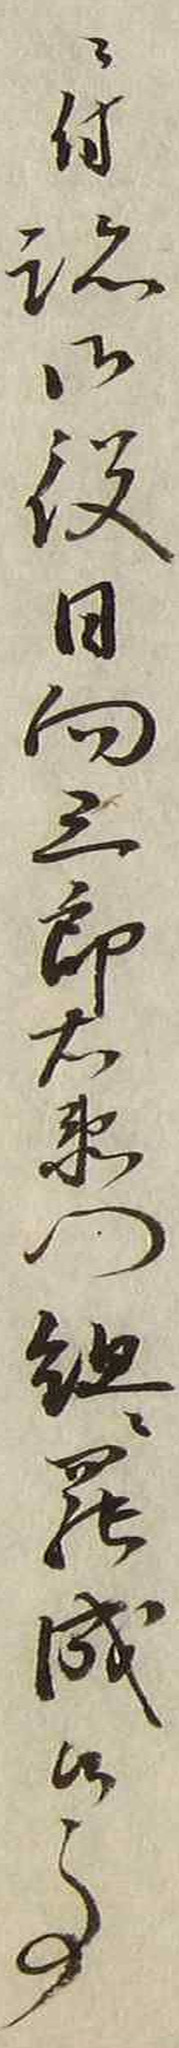ニ付跡御役日向三郎右衛門組ニ罷成候事

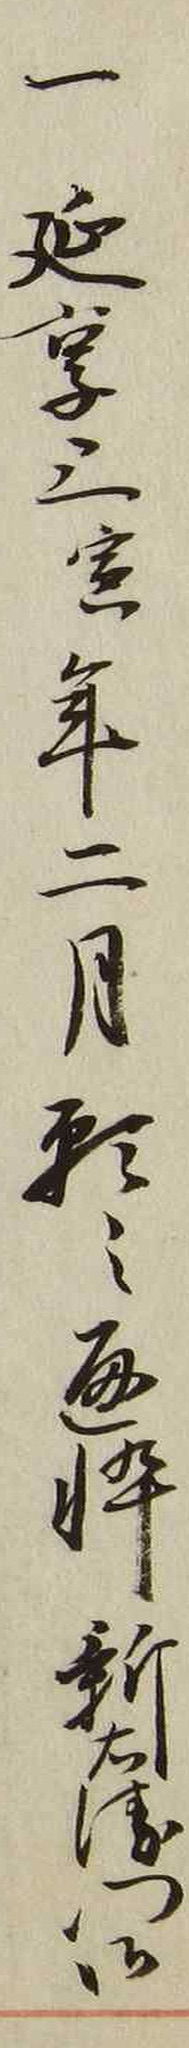一延享三寅年二月願之通忰新右衛門御
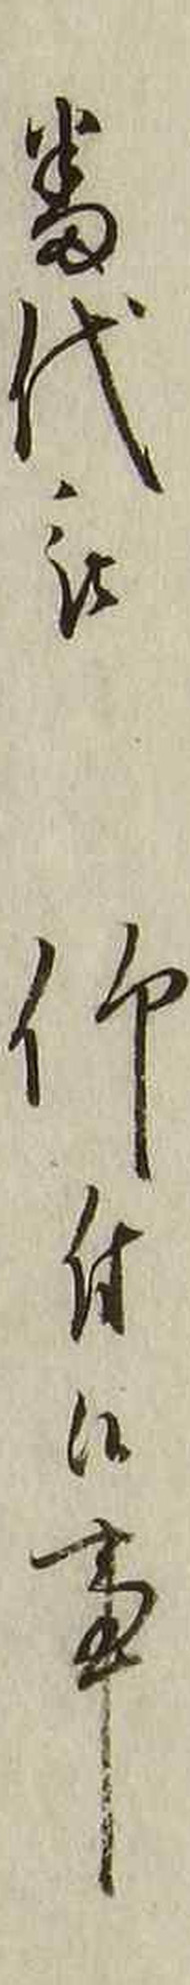番代被仰付候事
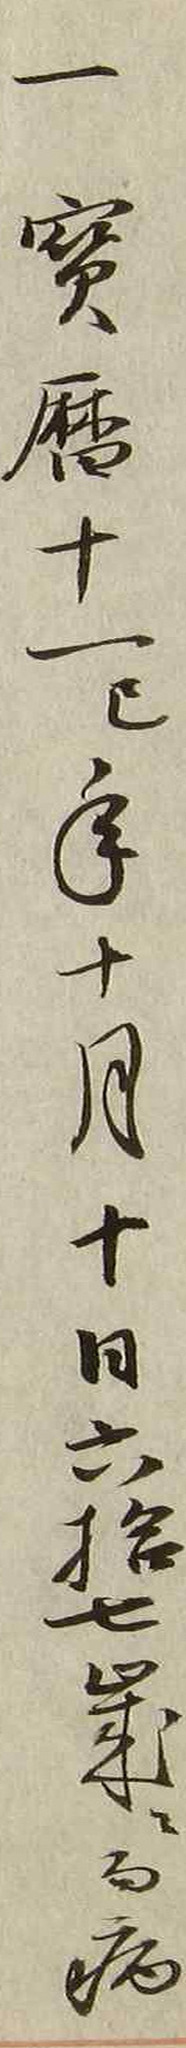一宝暦十一巳年十月十日六拾七歳ニ而病
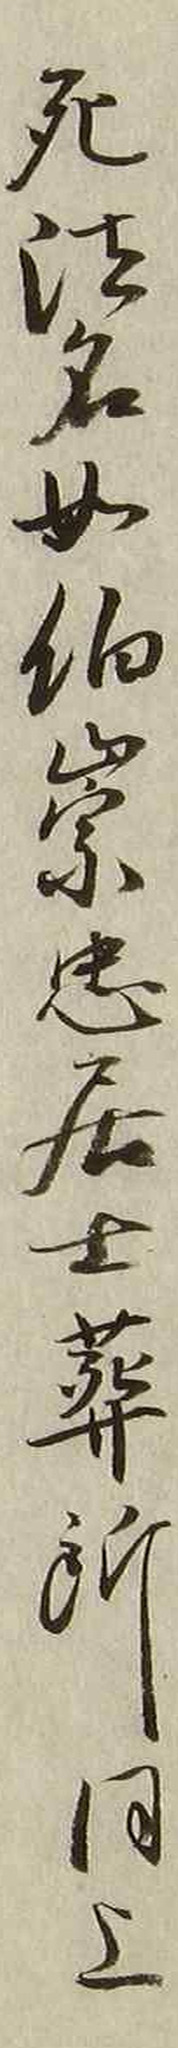死法名如伯崇忠居士葬所同上
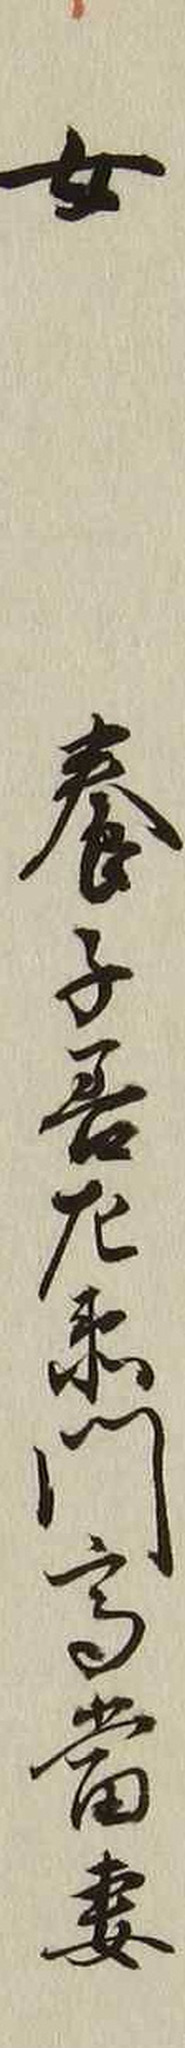女養子善左衛門高当妻
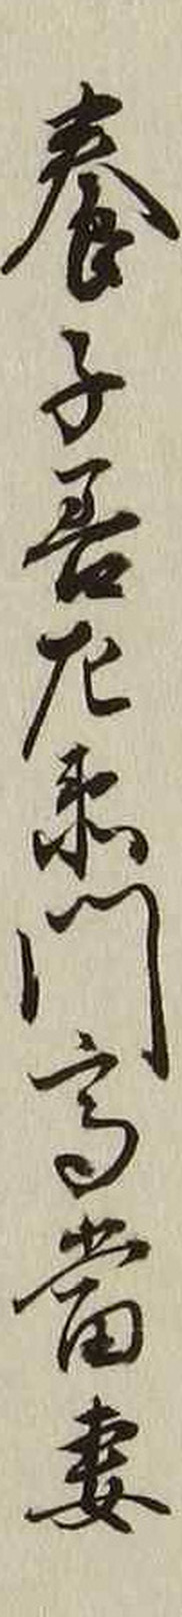女養子善左衛門高当妻
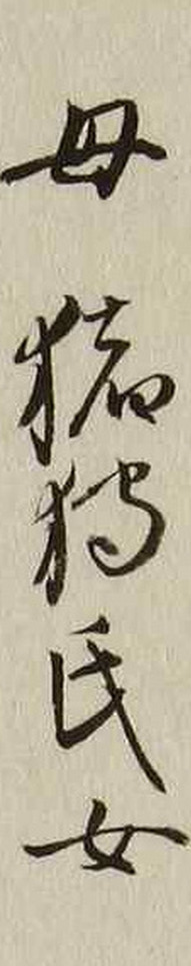母猪狩氏女
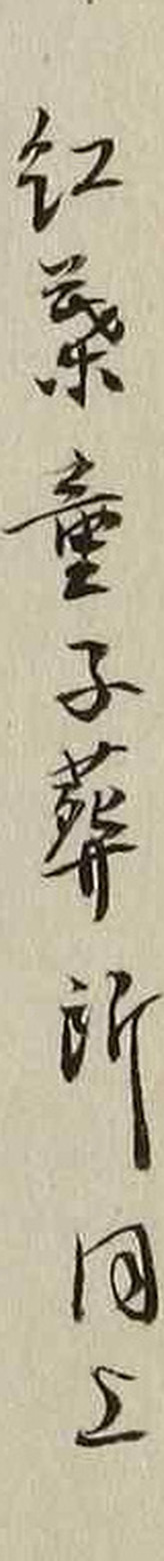紅葉童子葬所同上
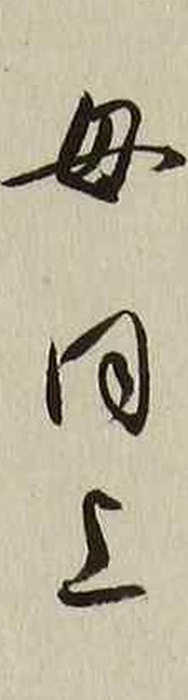母同上
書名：諸士系譜　巻之22　い之部22
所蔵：会津若松市立会津図書館
